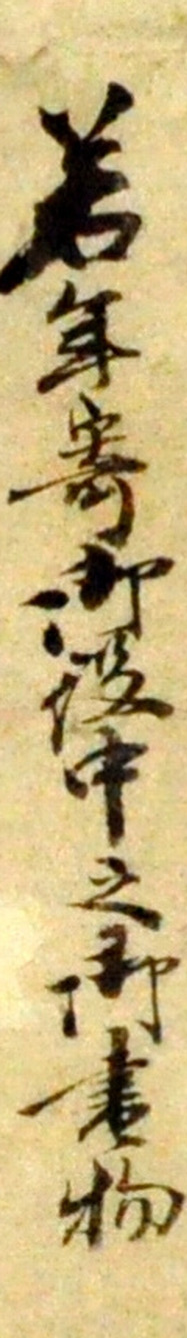若年寄御役中之書物
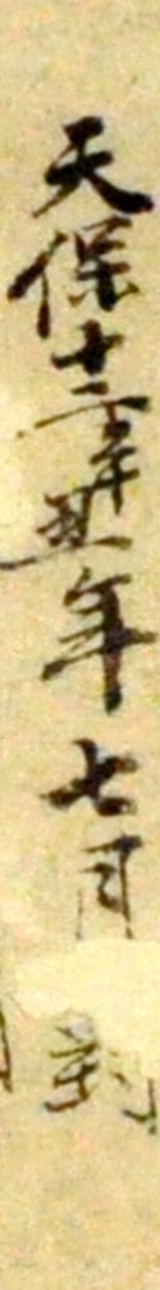天保十二辛丑年七月封

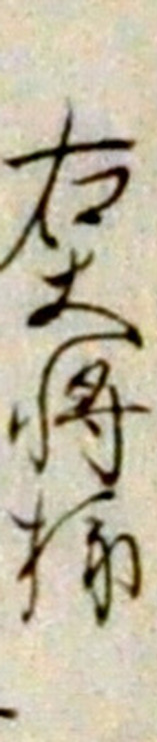右大将様
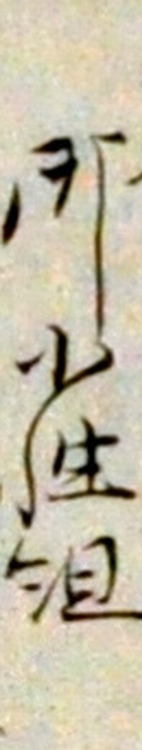御小性組
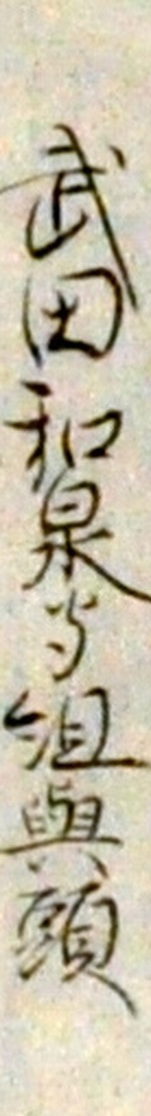武田和泉守組与頭
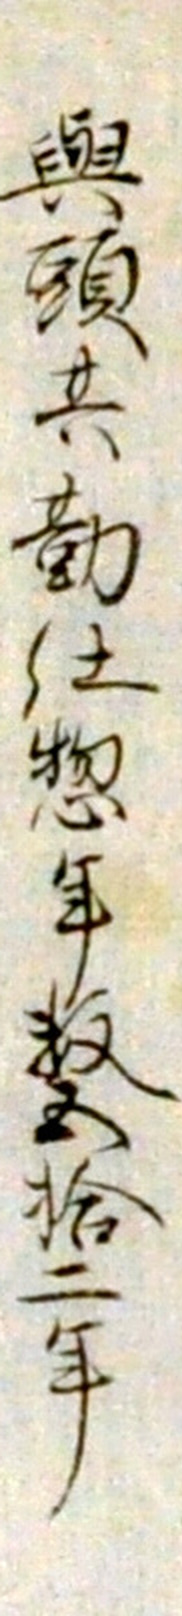与頭共勤仕惣年数五拾二年
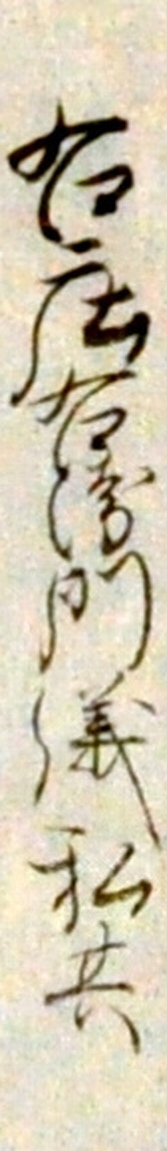右庄右衛門儀私共
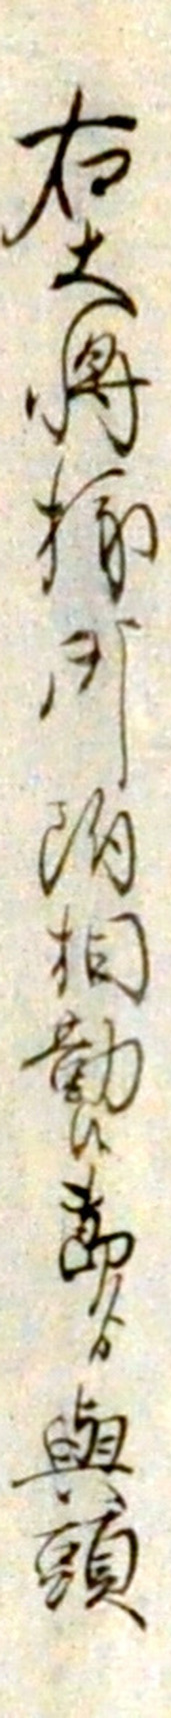右大将様御附相勤候節ゟ与頭
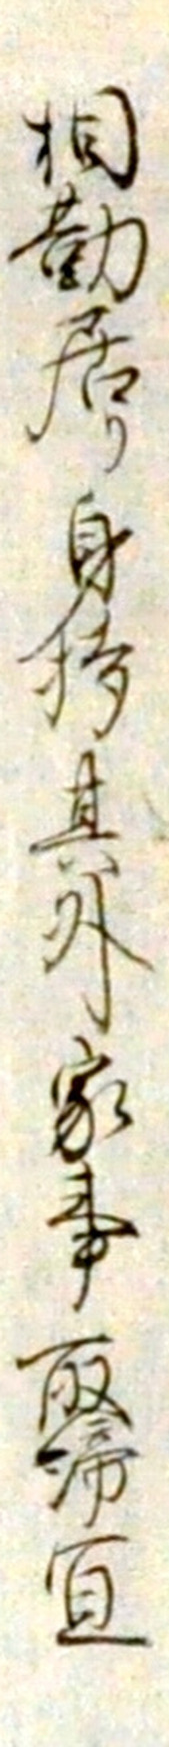相勤居り身持其外家事取締宜
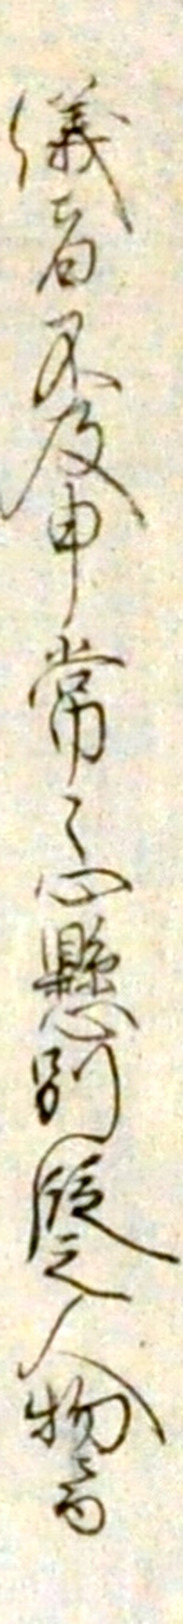儀者不及申常々心懸別段之人物ニ而
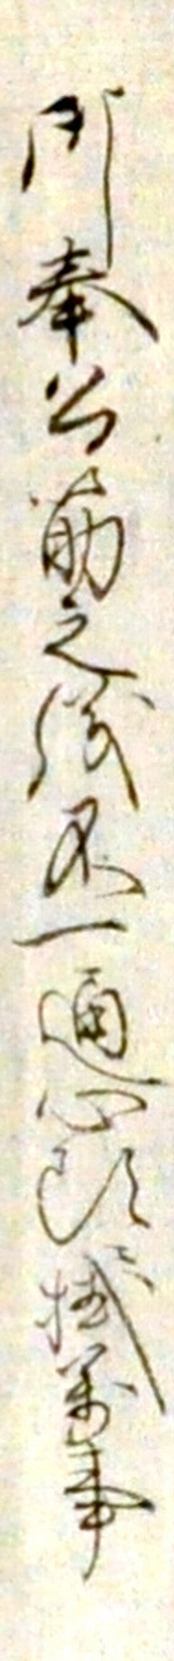御奉公筋之儀不一通心頭ニ掛万事
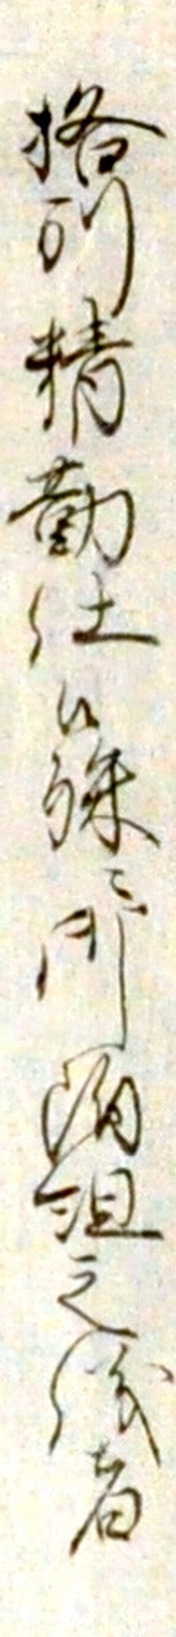格別精勤仕候殊ニ御附組之儀者
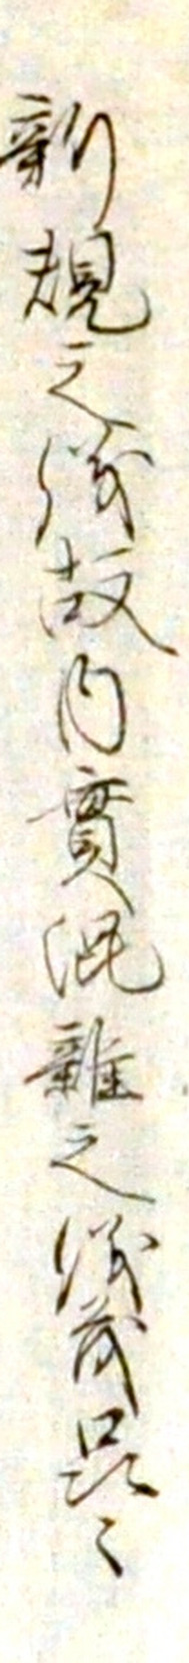新規之儀故内実混難之儀茂品々
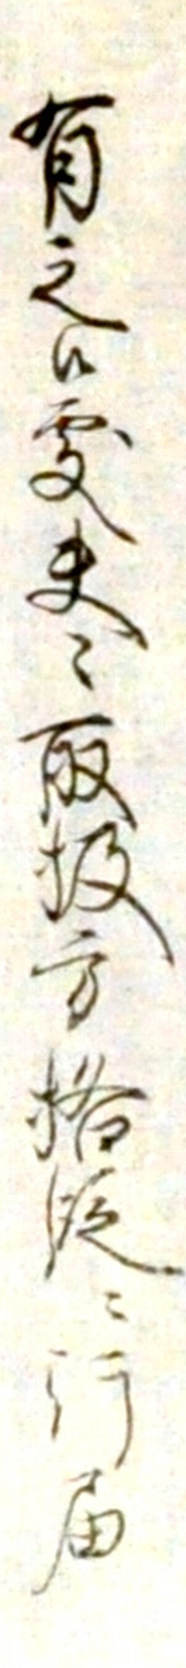有之候処夫々取扱方格段ニ行届
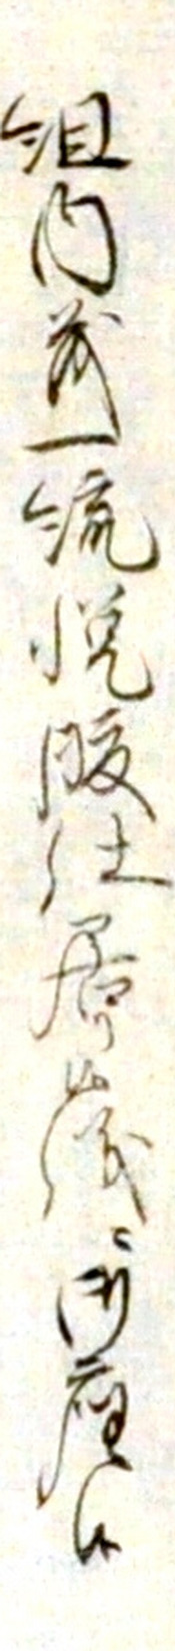組内茂一統悦腹仕居り候儀ニ御座候
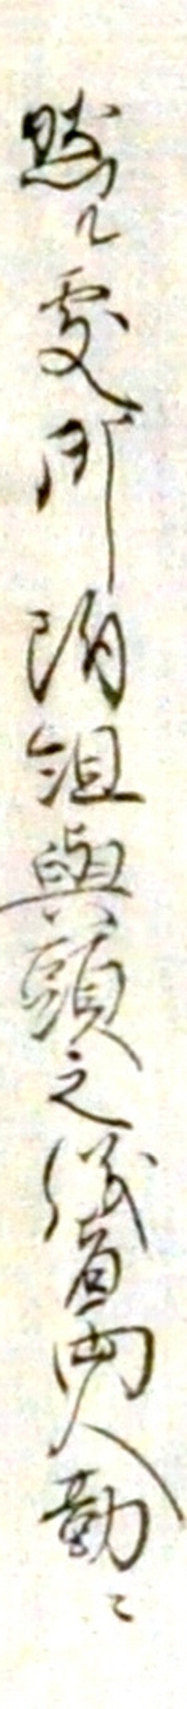然ル所御附組与頭之儀へ両人勤ニ
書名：若年寄御役中之御書物〔一括〕
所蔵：伊那市立高遠町図書館・合同会社AMANE
